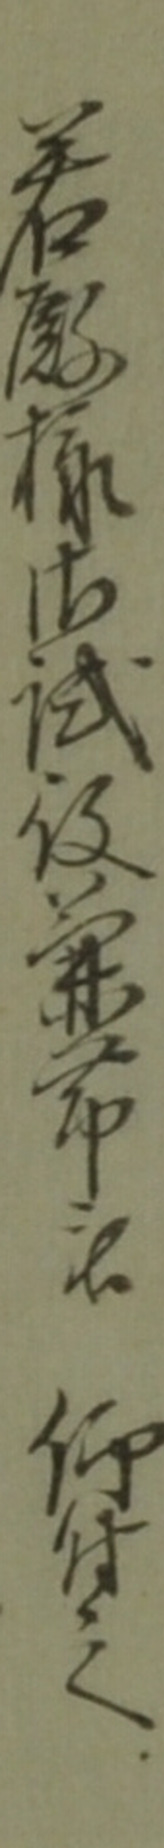若殿様御試役兼帯被仰付之
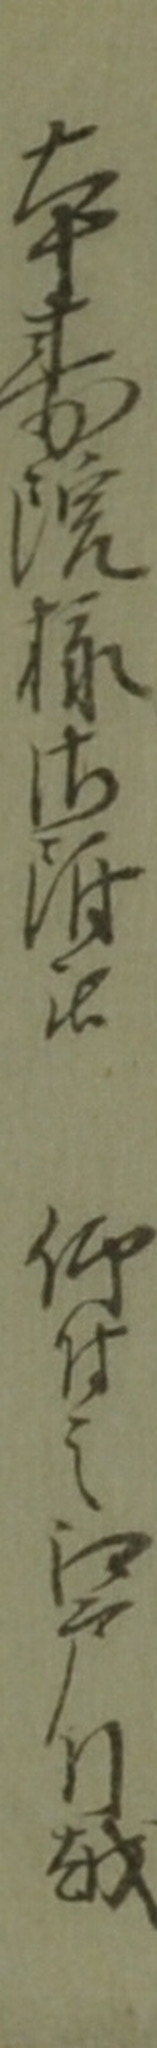本寿院様御附被仰付之江戸引越
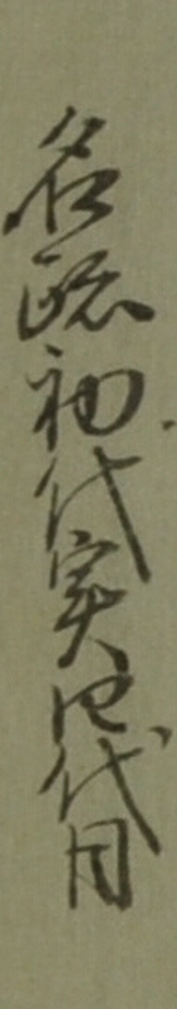名跡初代目実四代目
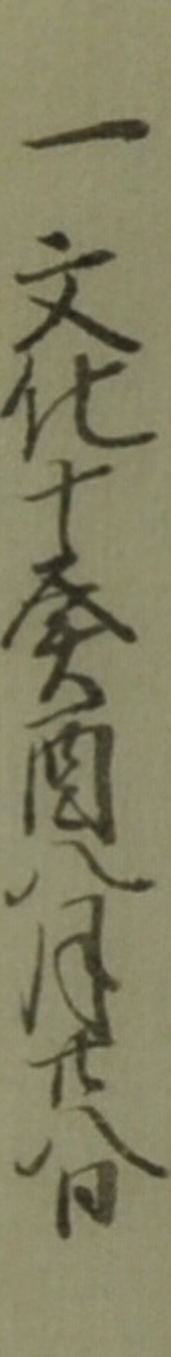一文化十癸酉八月廿八日
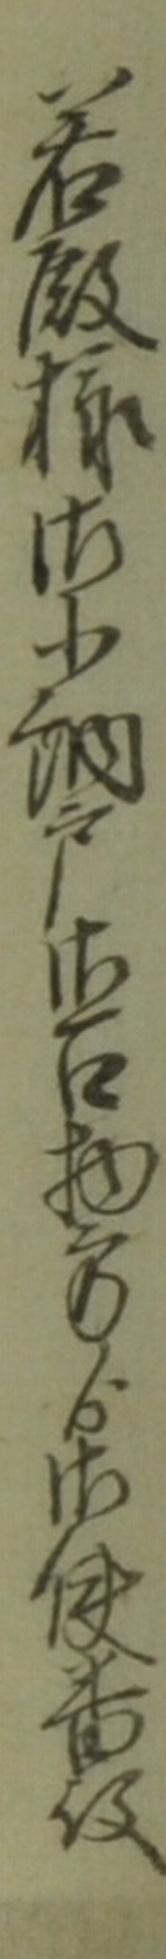若殿様御小納戸御召物方ゟ御使番役
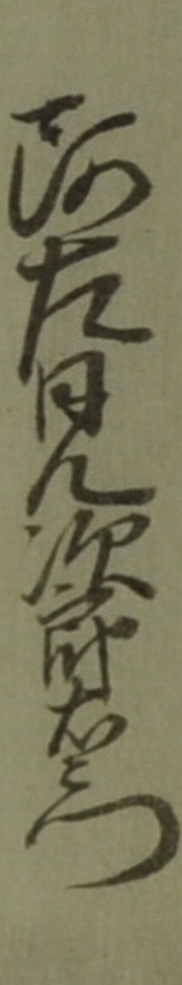阿左見次郎右衛門

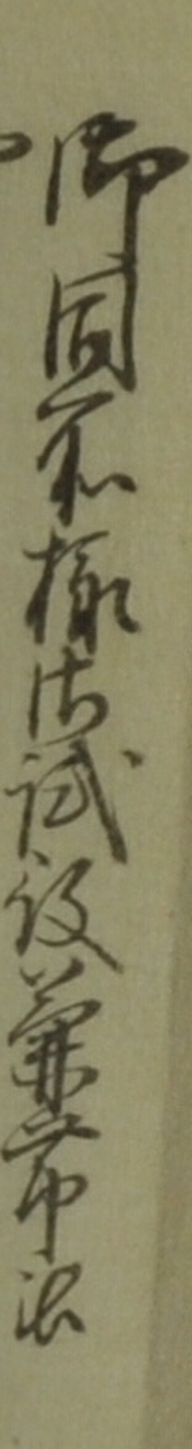御同所様御試役兼帯被
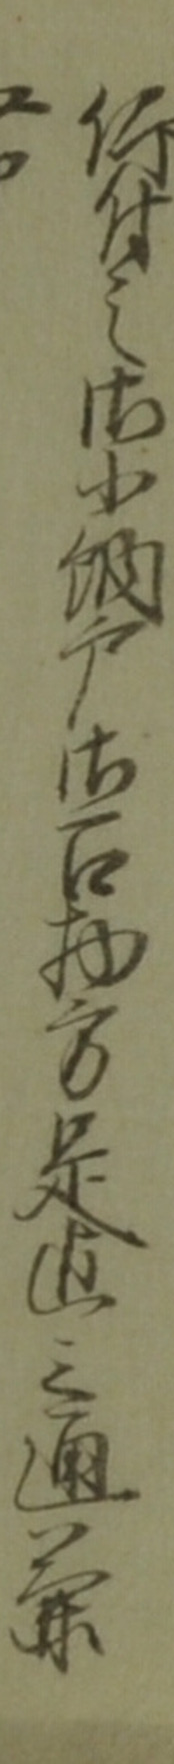仰付之御小納戸御召物方是迄之通兼
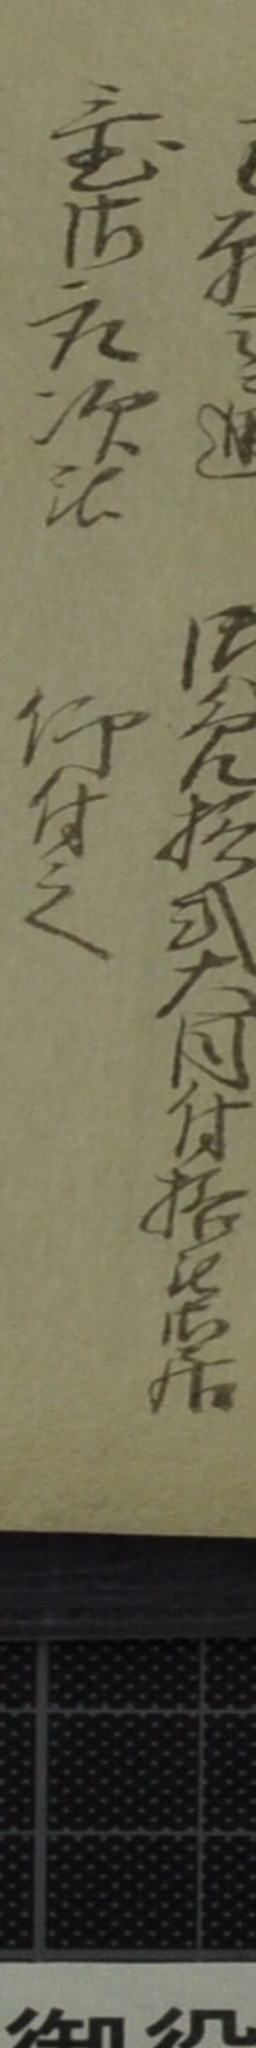置御取次被仰付之
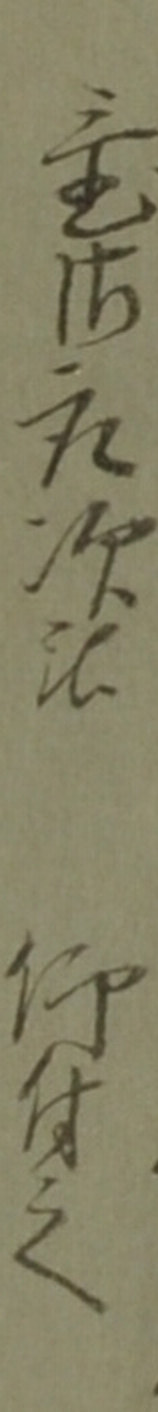置御取次被仰付之
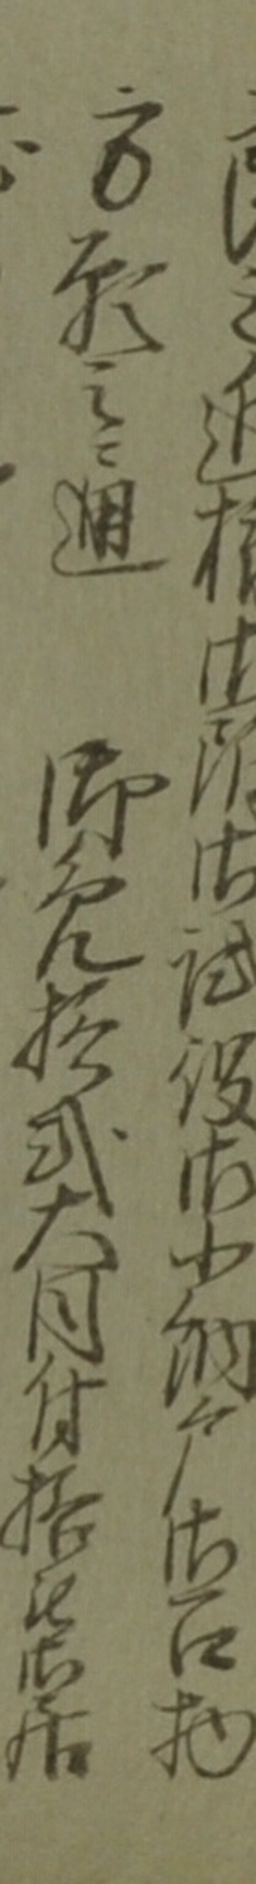方願之通御免方格式大目付格被御居
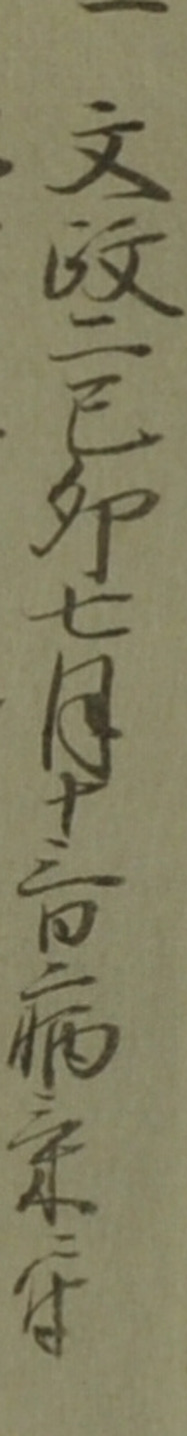一文政二己卯七月十三日病気ニ付
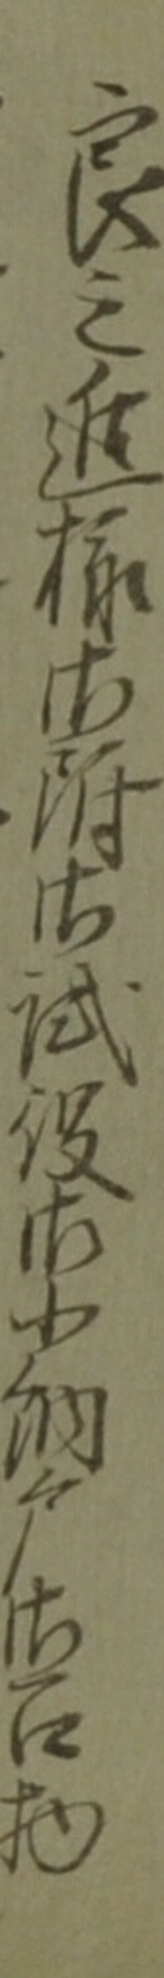良之進様御附御試役御小納戸御召物
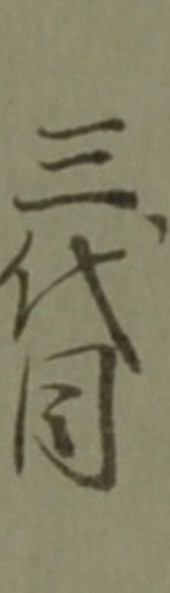三代目
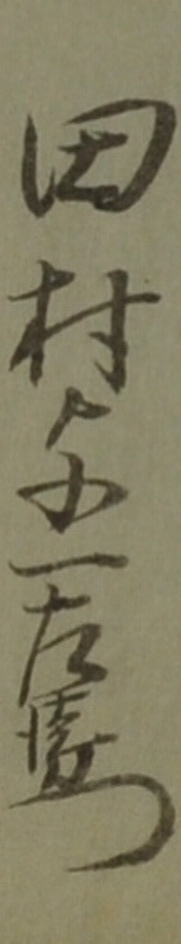田村与一左衛門
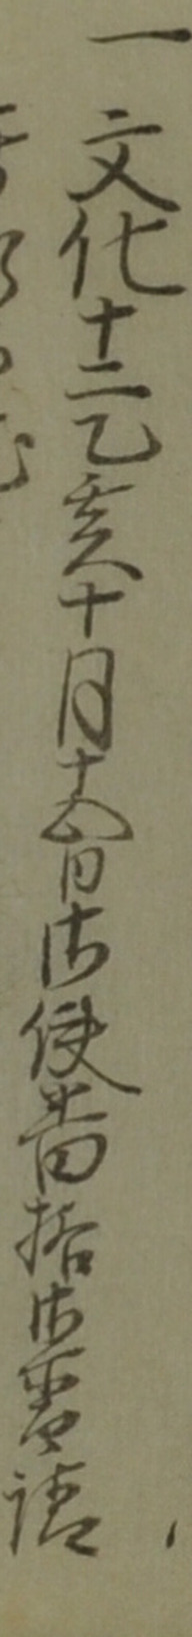一文化十二乙亥十月十五日御使番格御普請
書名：諸御役代々録（四）
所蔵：伊那市立高遠町図書館・合同会社AMANE
